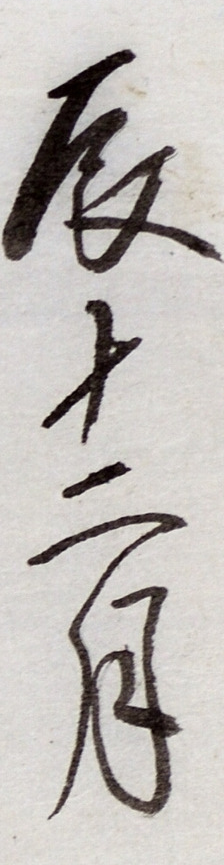辰十二月
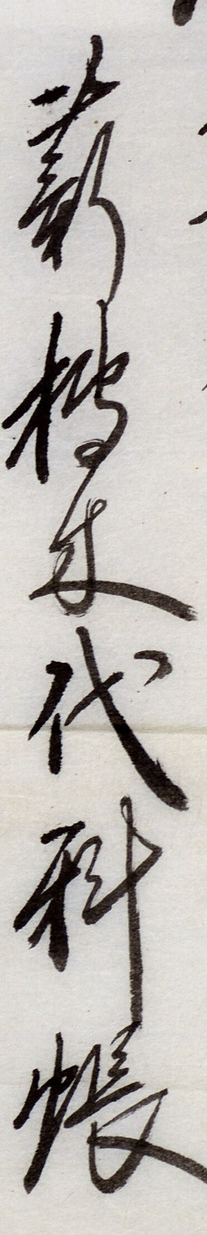薪槫木代料帳
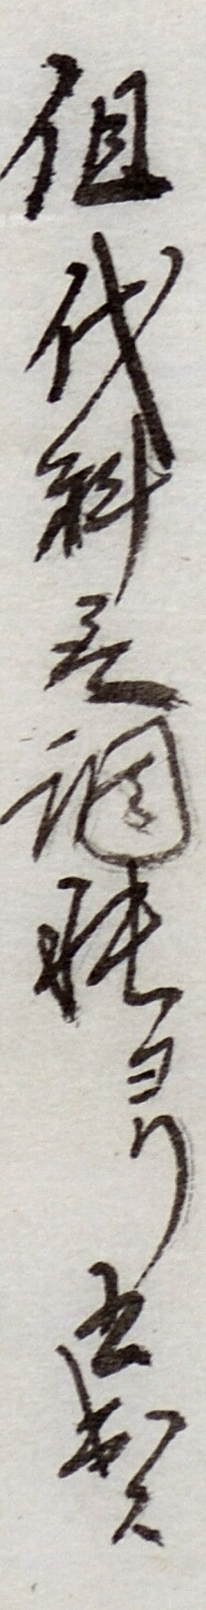但代料取調帳ヨリ書出ス
